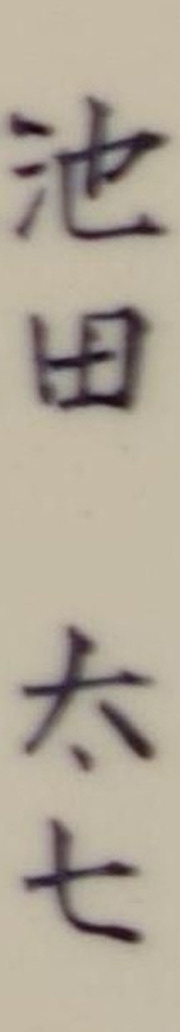池田太七
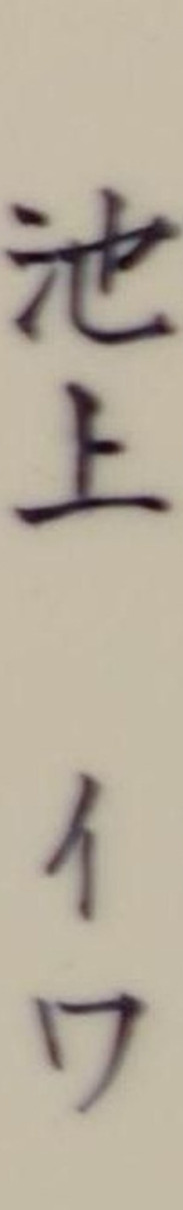池上イワ
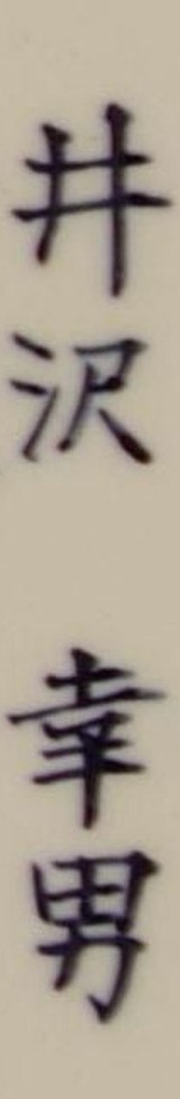井沢幸男
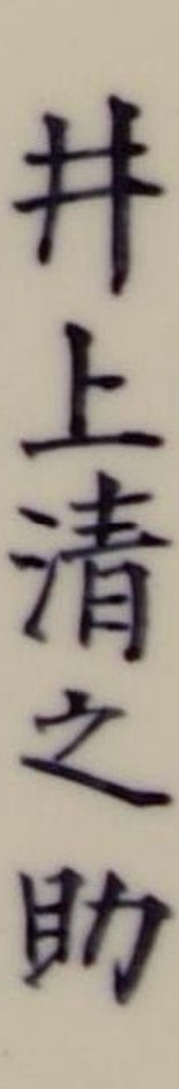井上清之助
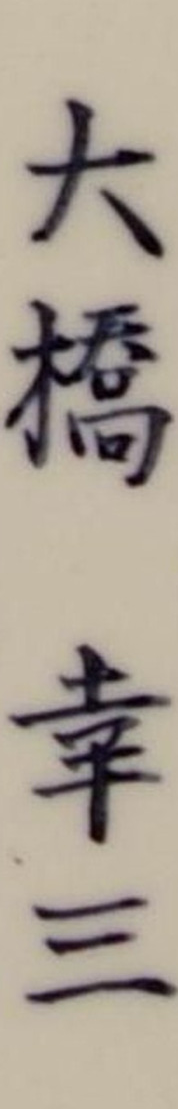大橋幸三
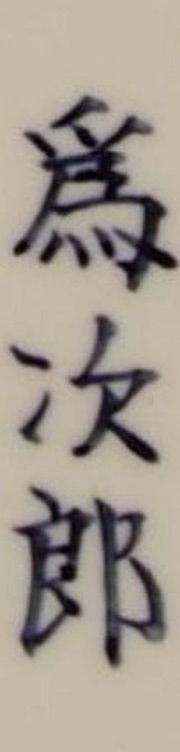為次郎
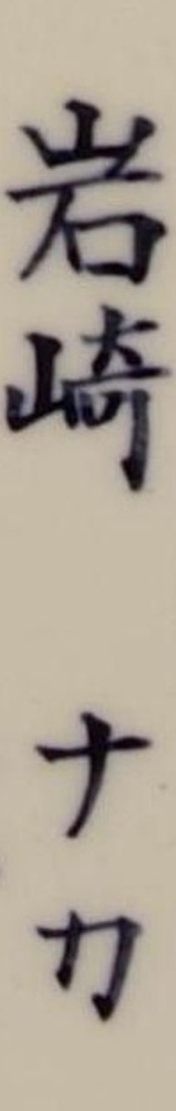岩崎ナカ
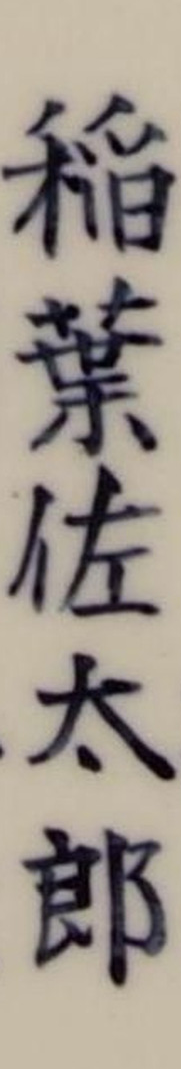稲葉佐太郎
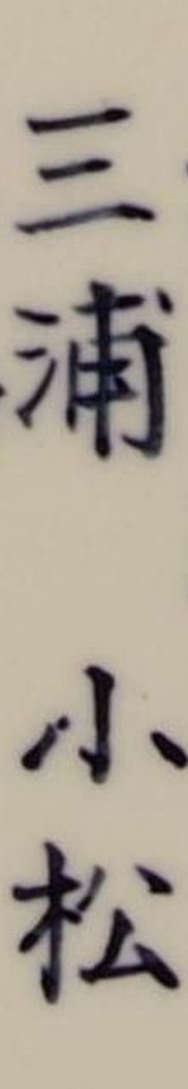三浦小松
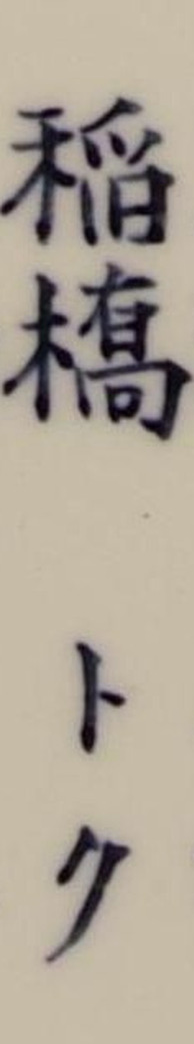稲橋トク
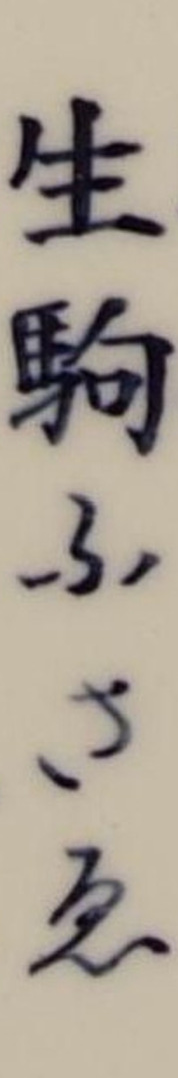生駒ふさゑ
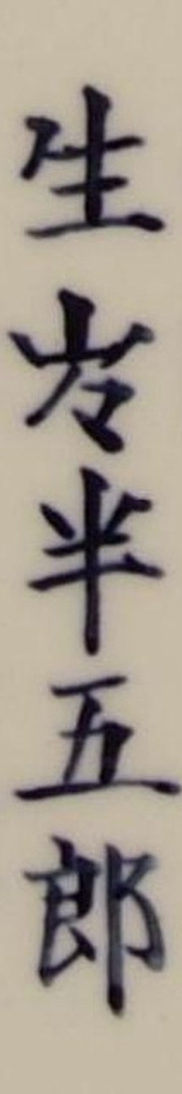生㞮半五郎
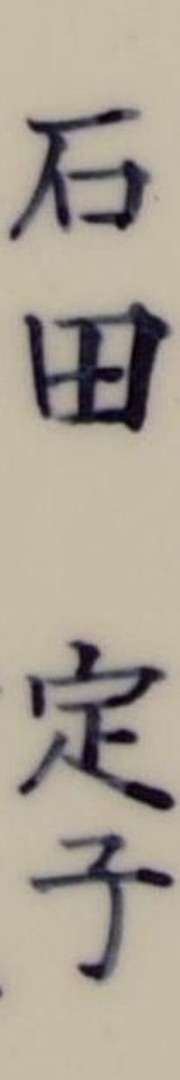石田定子
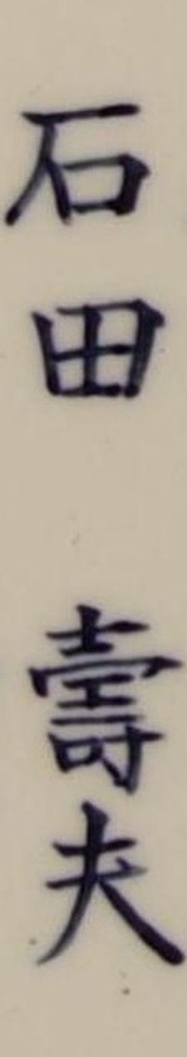石田壽夫
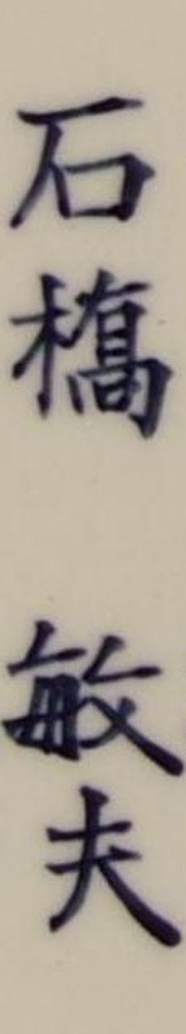石橋敏夫
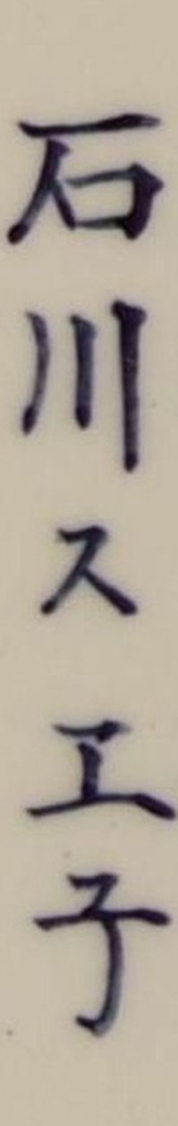石川スエ子
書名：M~S
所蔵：高野山金剛峯寺
